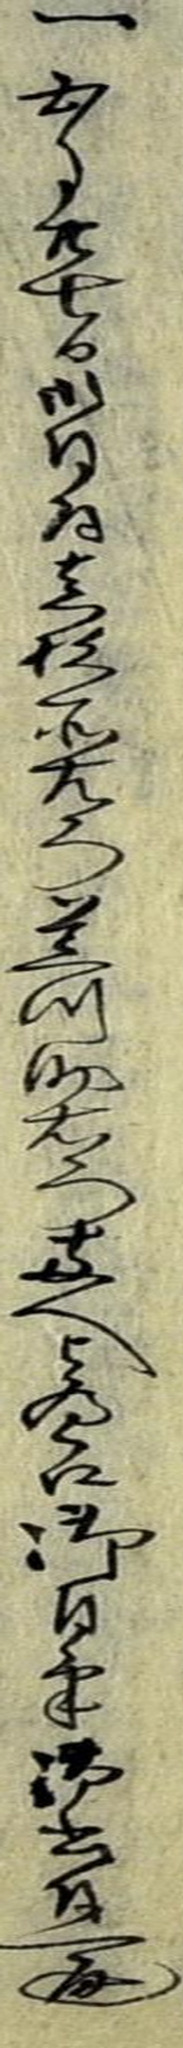一五月廿七日御目付真杉所左衛門荒川助右衛門両人被為召御自筆御書付一通
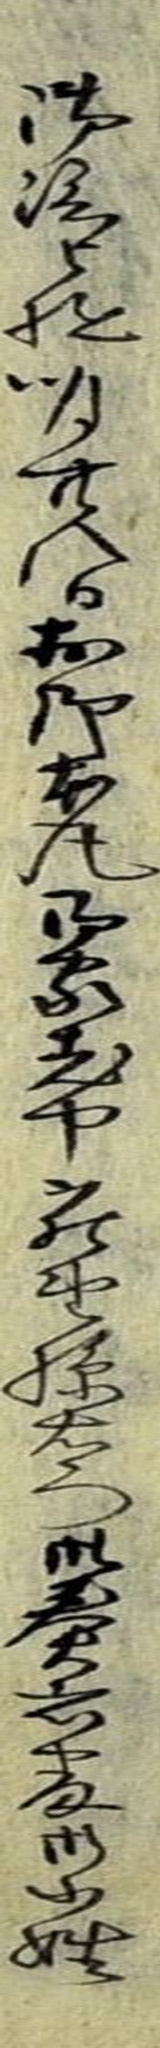御渡被遊明廿八日於御本丸御家老中荻野孫右衛門御奏者番御小姓
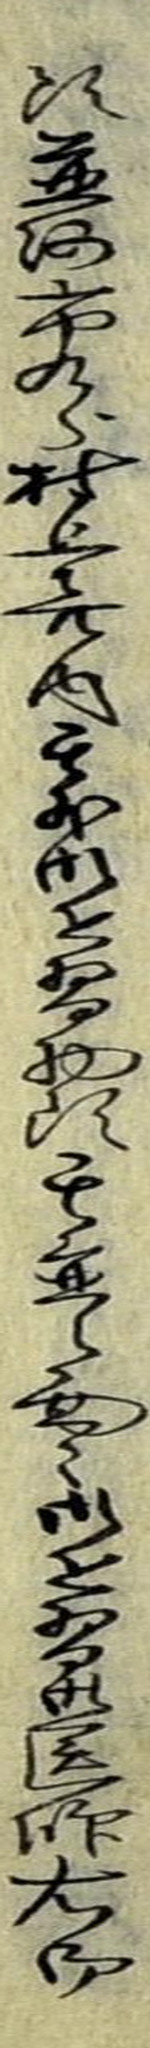頭並河市九郎村上喜内其外御近習物頭其並之面々御近習御医師右御
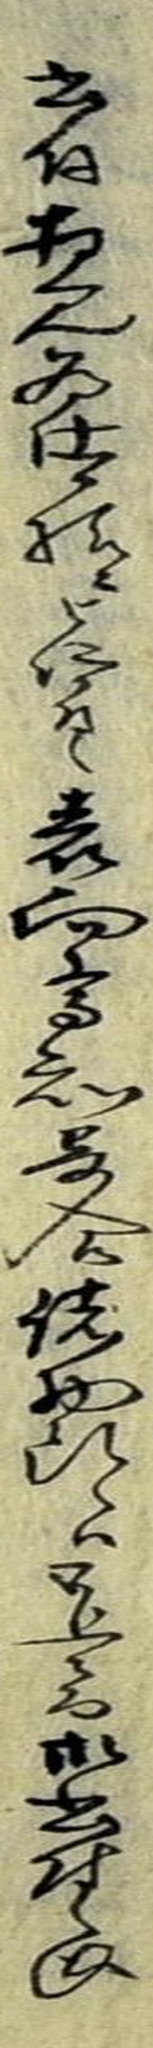書付拝見為仕候様ニ被仰付候表向高知寄合諸物頭ヘハ口上ニ而御書付之趣
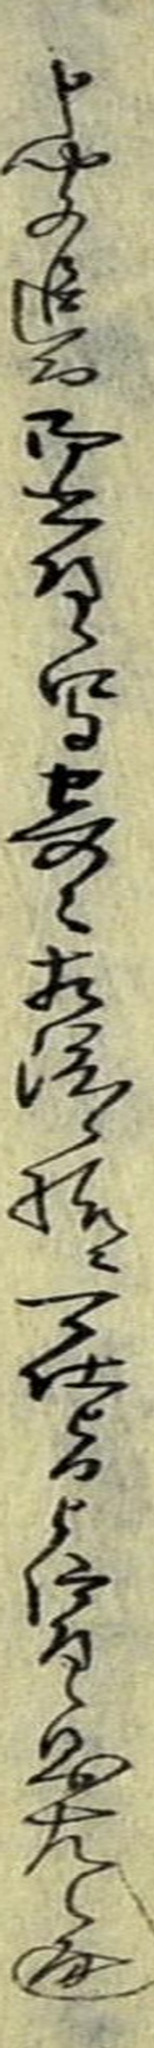申聞追而御書付之写寄々相渡候様ニ可仕旨被仰付候則左之通
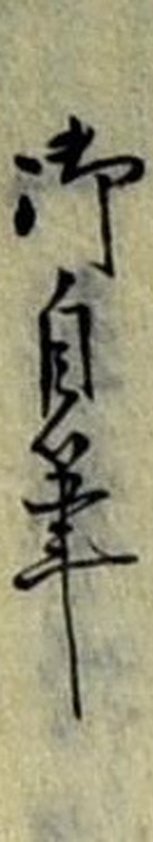御自筆
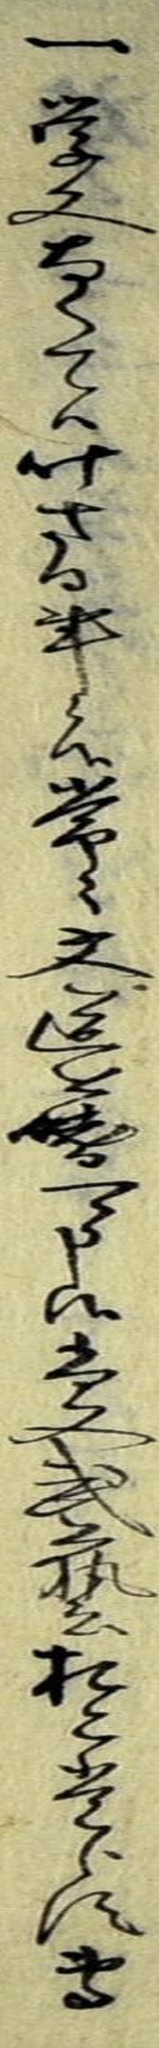一学文なくてハ叶さる事ニ候常々文道を嗜可申候尚又武芸おこたらす専

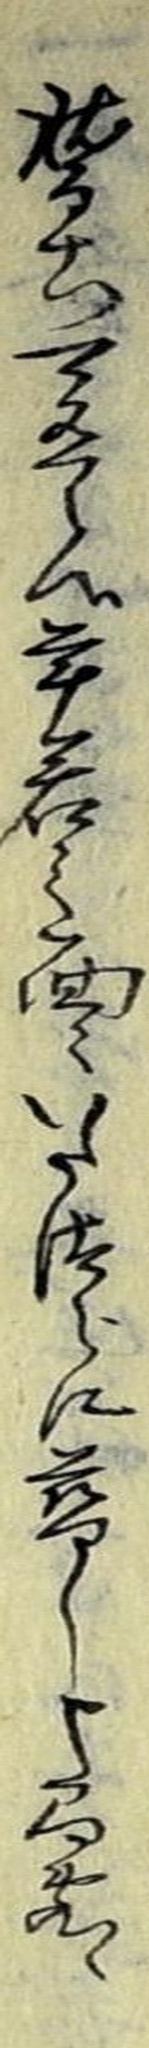稽古可有之候年若之面々いたつらに暮し申間敷候
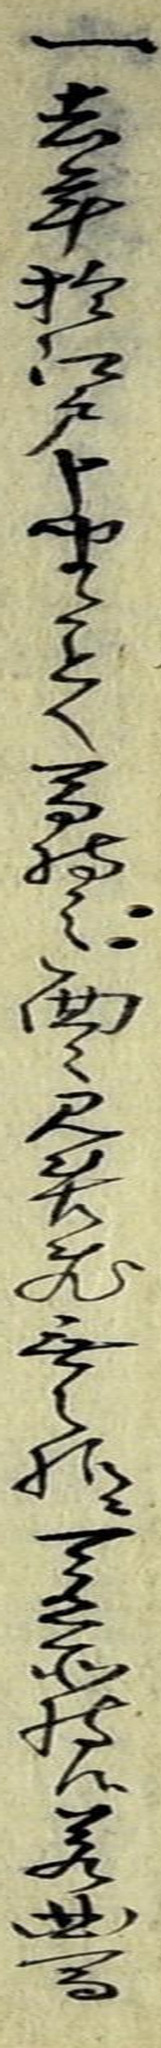一去年於江戸申聞候ことく馬持之面々見苦敷無之様ニ可有所持候若曲馬
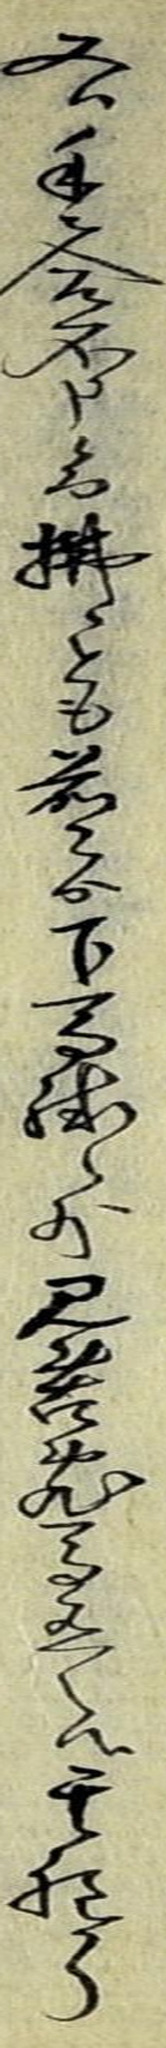又ハ手ニ合不申ニ而払候とも前々ゟ下馬殊之外見苦敷馬有之候其程了
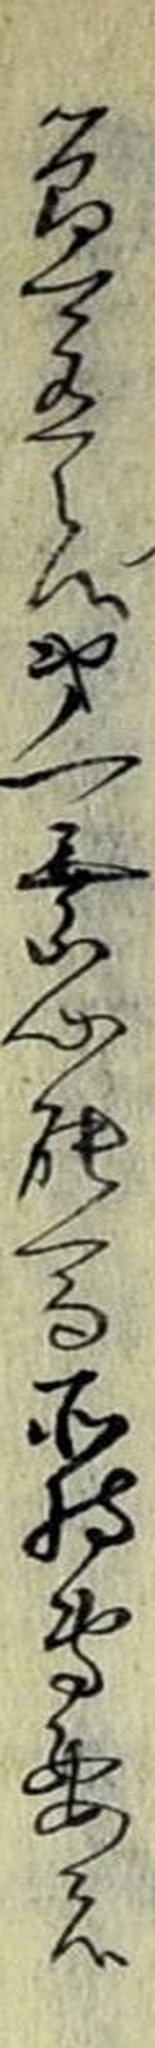簡可有之候第一乗心能馬所持専要ニ候
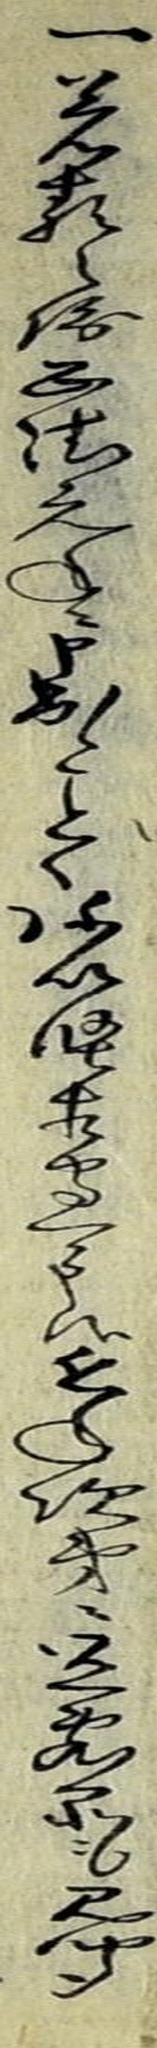一着類之儀正徳元年ニ申出候ことく弥以堅相守可申候近年次第ニ宜敷品も見聞
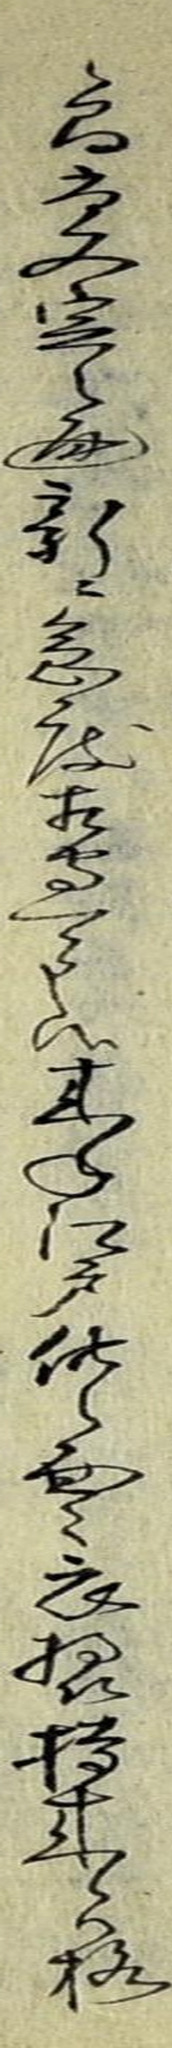候間尚又定之通新ニ急度相守可申候来年江戸供之面々衣装持来候ハ格
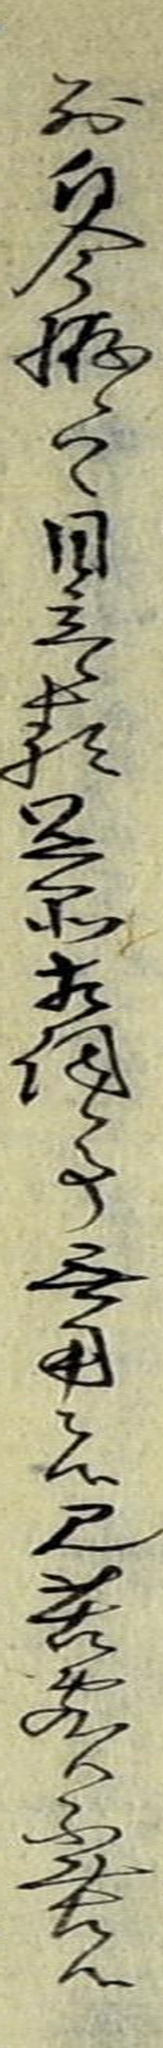別自今拵候ハヽ目立候類宜品相調候事無用ニ候見苦敷ハ不苦候
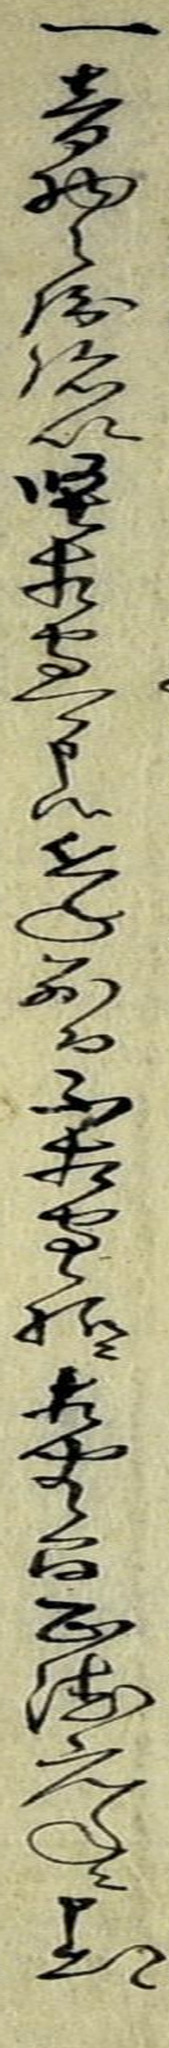一音物之儀弥以堅相守可申候近年別而不相守候様ニ相聞候間正徳元年ニ申出候
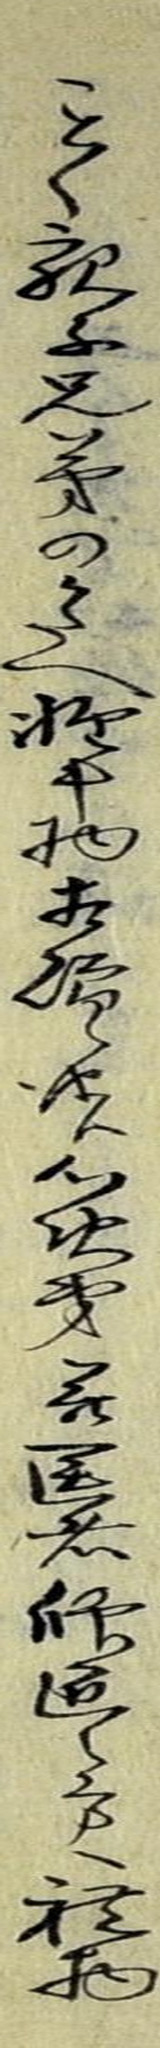ことく親子兄弟のかたへ軽キ物相贈候儀ハ心次第并医者師匠之方へ礼物
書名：命令之部 一
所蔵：福井県文書館 Fukui Prefectural Archives
